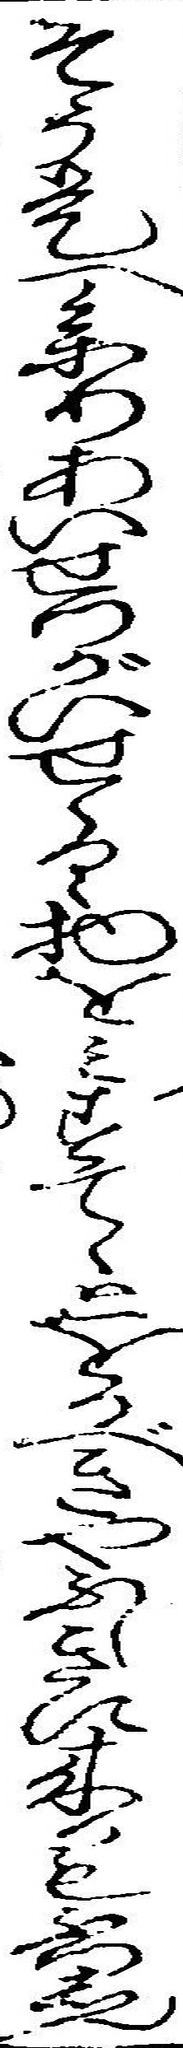そう是へ参りあいせつがいせらるゝ物をみすてゝとをるべきやふしきに来るもふつしん
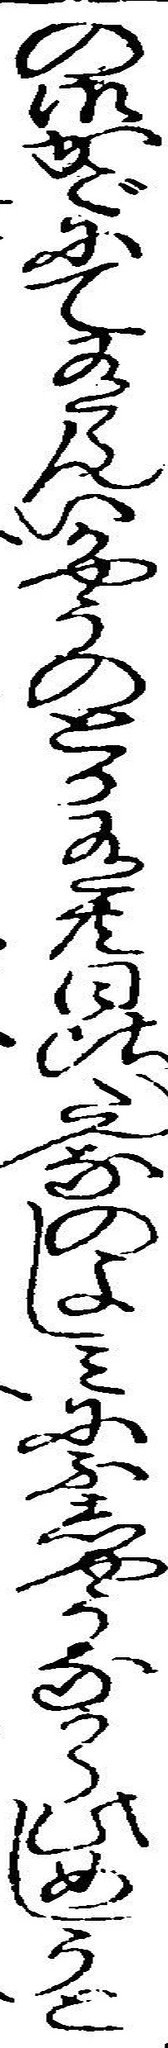の御かごにて有らんいかやうのとか有共日頃たんなのよしみにふしやうなから此めしうと
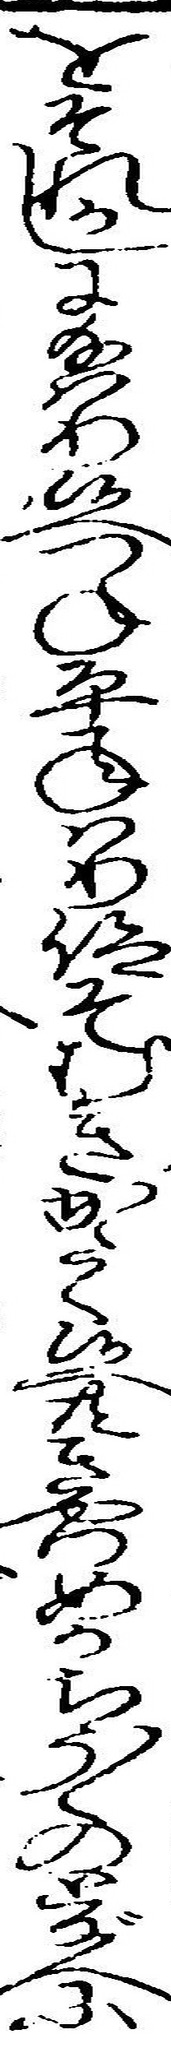をそれかしに給はり候へつね平承はり仰そむきかたく候へ共きやつめからう〳〵のとが人に
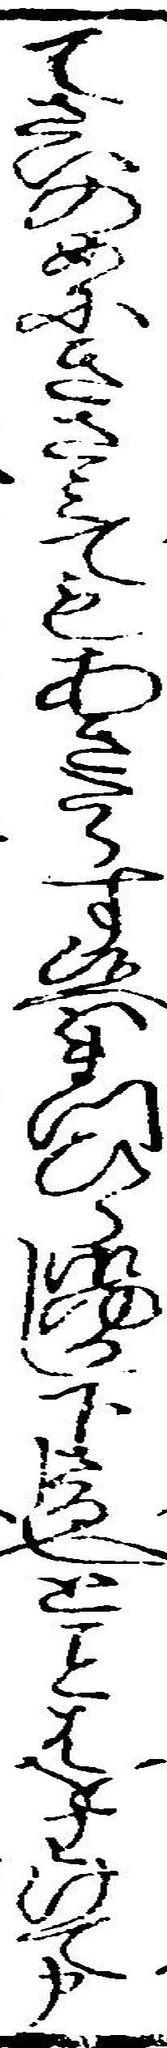てさいのめにきさみてもあきたらす候へはまつひら御ゆるし下さるへしとことはをわけて申
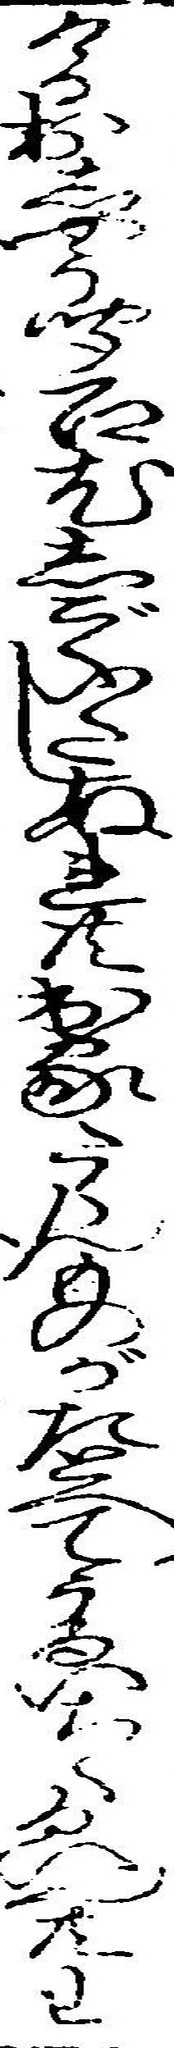けるおしやう聞召尤しごくいたしぬれ共出家たらんものがたとへてうるいちくるい也共わ
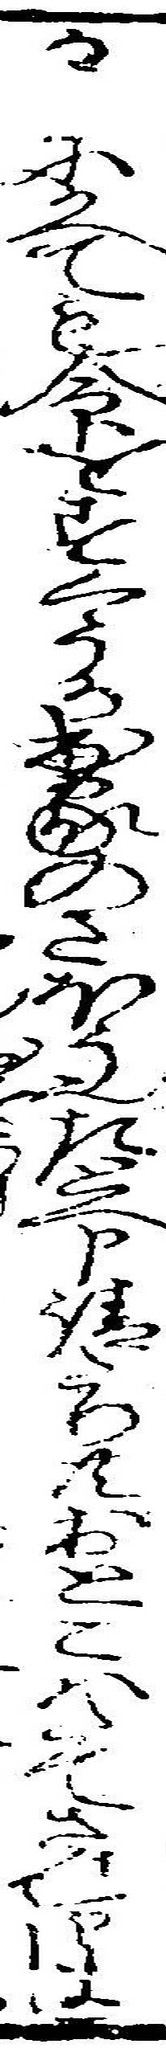かにかへても命をすくうか出家のさほう也たとへ申請たり共おとこはたてさせ申まし
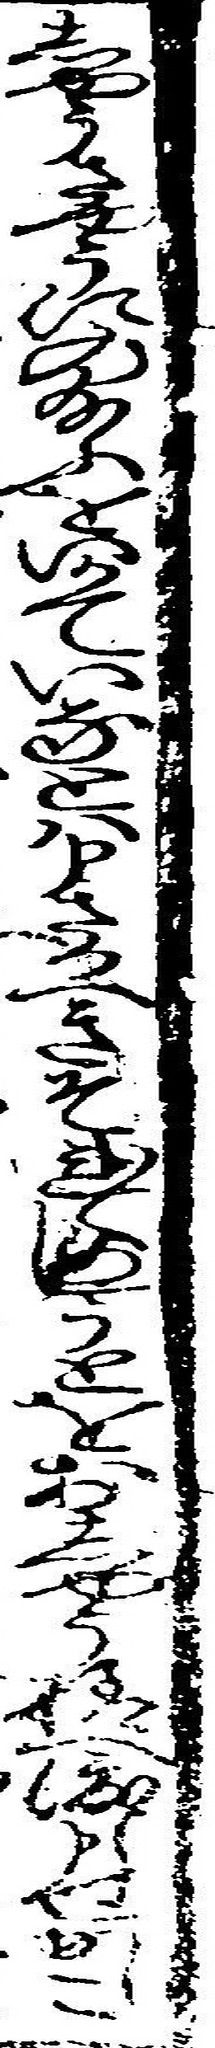しやうさやうにの給ふをいかていなとは申さるへきそれ〳〵めしうとをおしやう様へ渡し申せかしこ
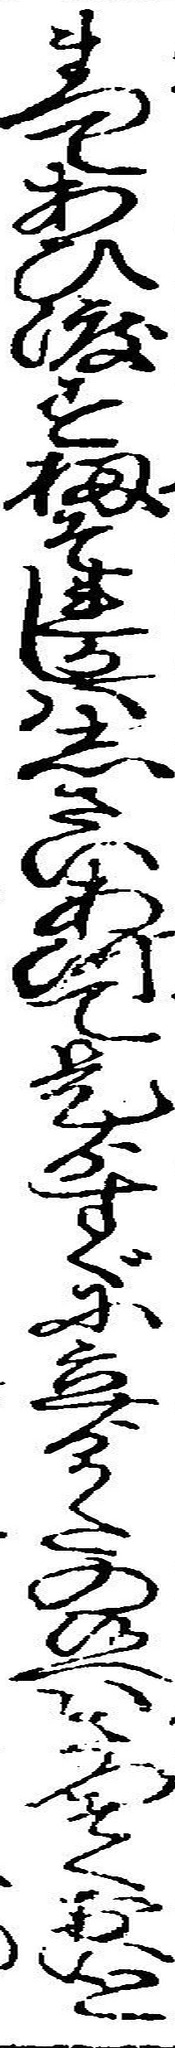まつてあひ渡す扨それかしはしさいあつて是よりすぐに立ゟかたの候へはさつそくおいと
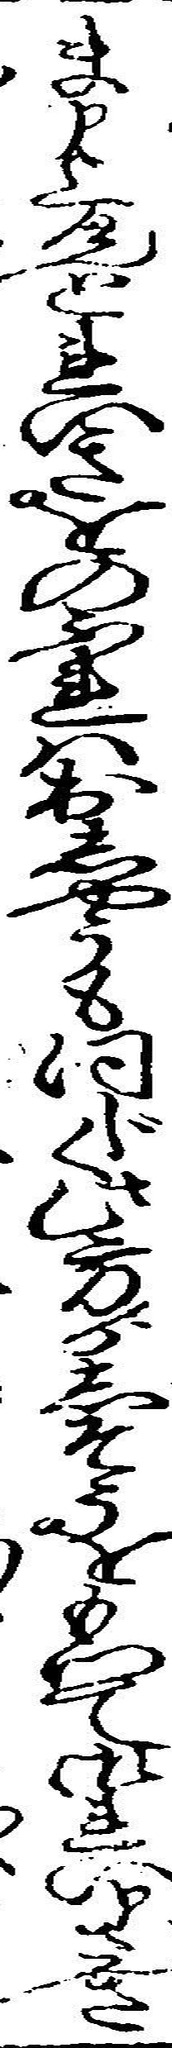ま申上けんとれいきをのふれはおしやうも同じく此方ゟしそうをもつて御れい申さんさ
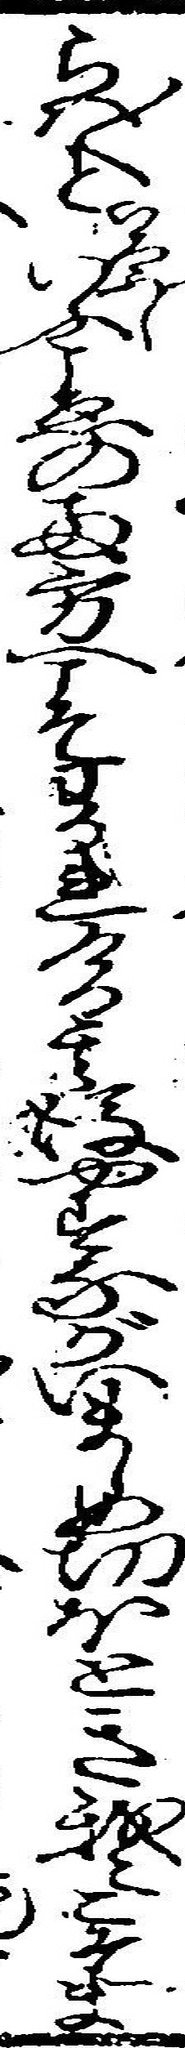らは〳〵といろふしいふこゑの両方へこそわかれける其後やすながいましめ切ほとき我々こそま
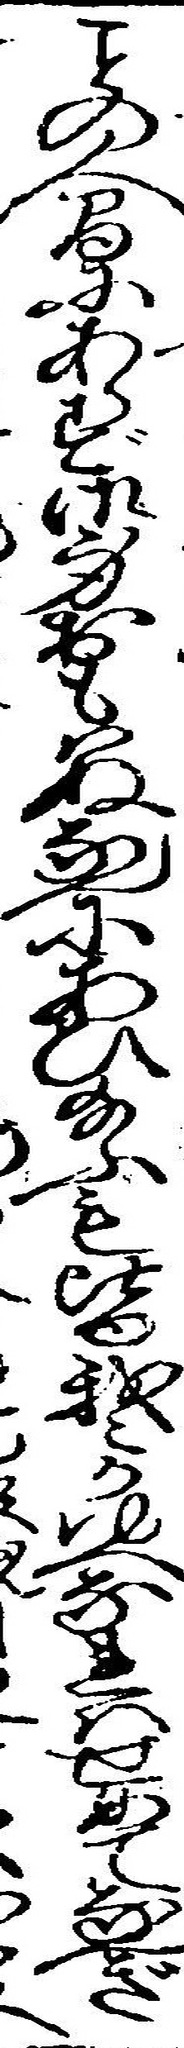ことの人間にあらず御身おもはぬなんにあひ給ふも皆我々かゆへなれはせめてなんぎ
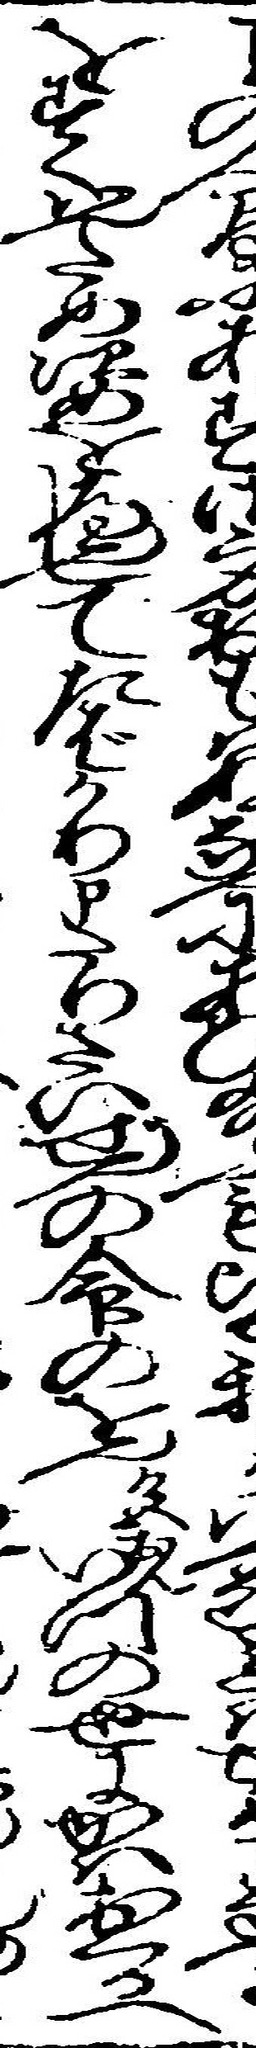をすくはんため姿をへんしてたばかり申たりさいぜんの命の色おんいつの世にかはおくるへ
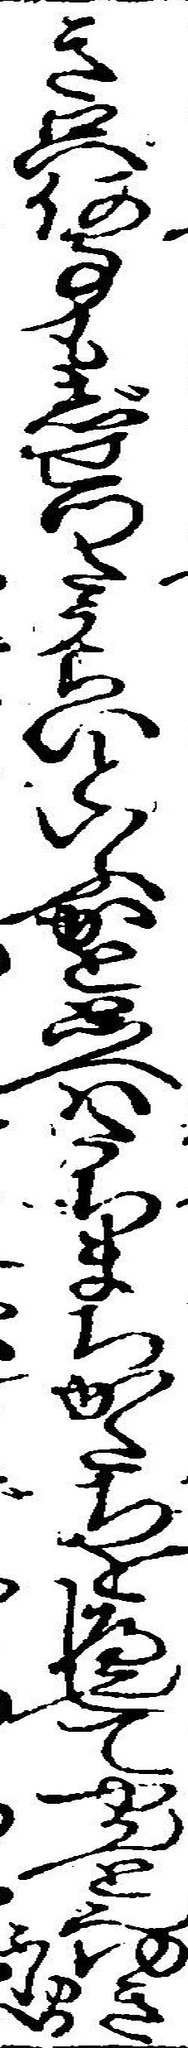き只何事もじせつたうらいといふかと思へはたちまちかたちをへんしてやかんと也ゆき
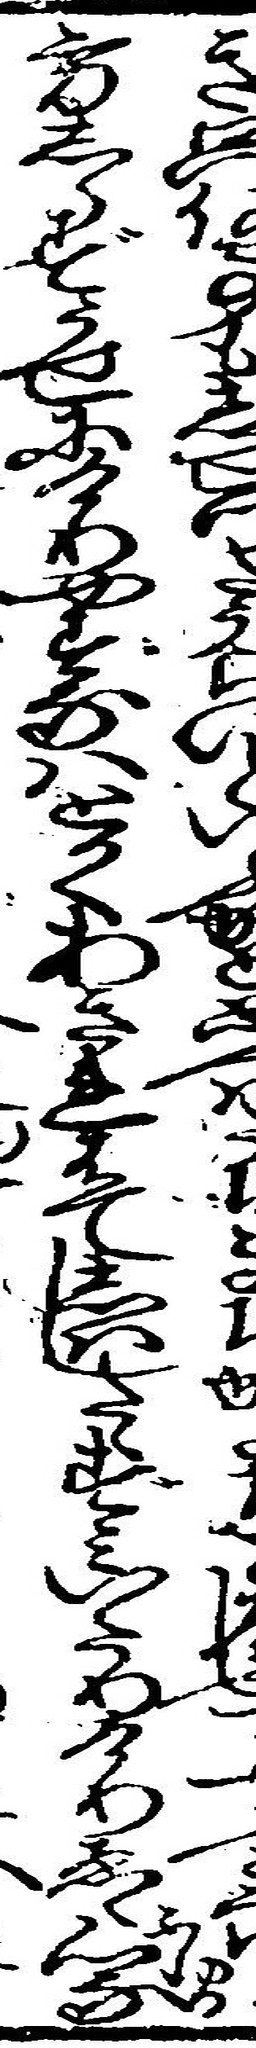方しらずうせにけりやすなはとかくあきれはてしはしたゝずみいたりけりゑゝふしゆり心な
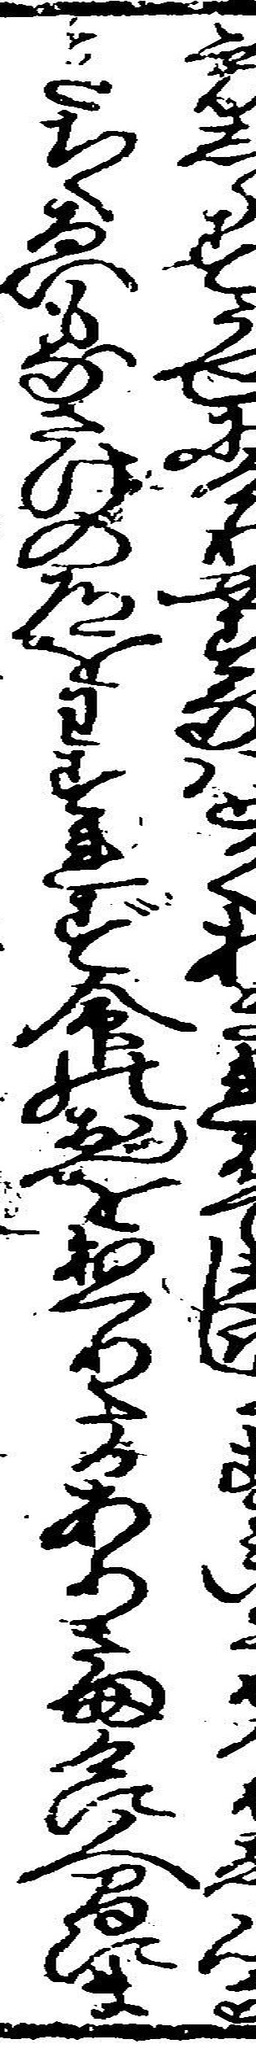きちくるいもなさけの道をわすれず命のおんをおくりたるありさまけに人間にま
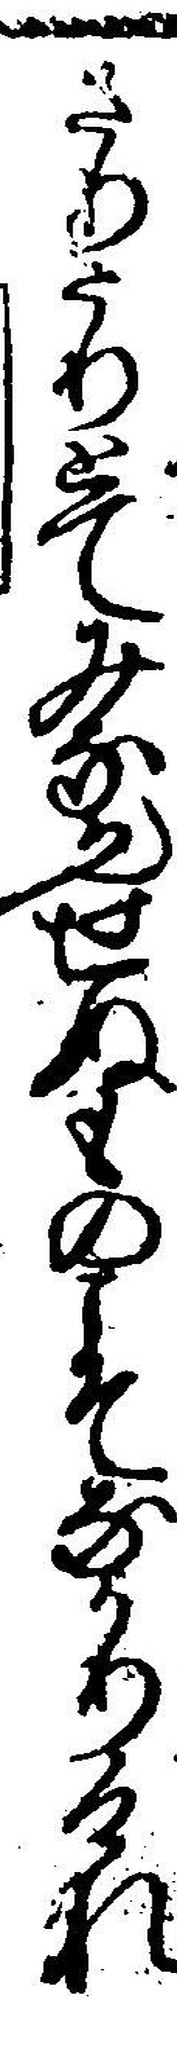さりたりとてみなかんせぬものこそなかりけれ
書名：[しのだづまつりぎつね付あべの清明出生]
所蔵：東京大学総合図書館 General Library in the University of Tokyo, JAPAN
